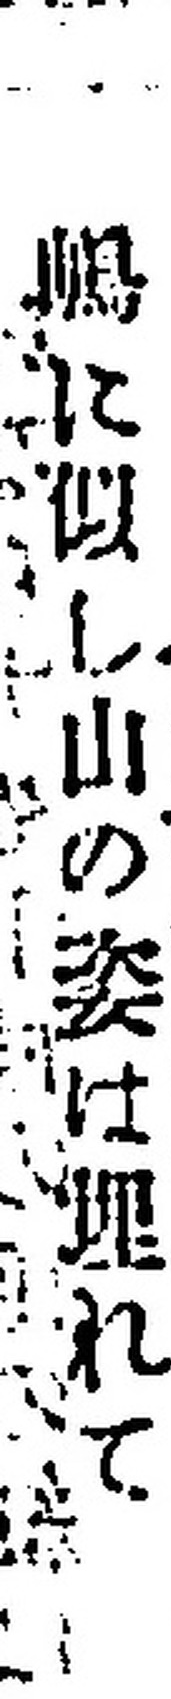嶋に似し山の姿は埋れて
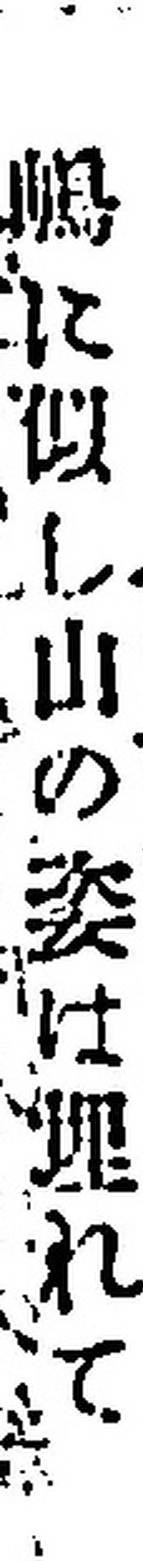嶋に似し山の姿は埋れて
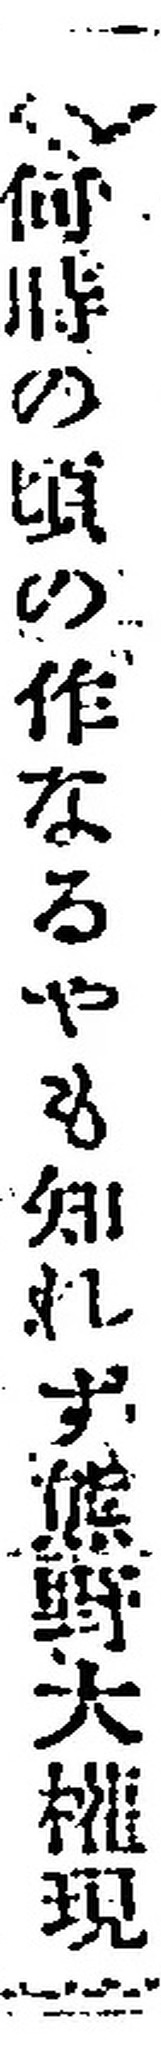何時の頃の作なるやも知れず熊野大権現
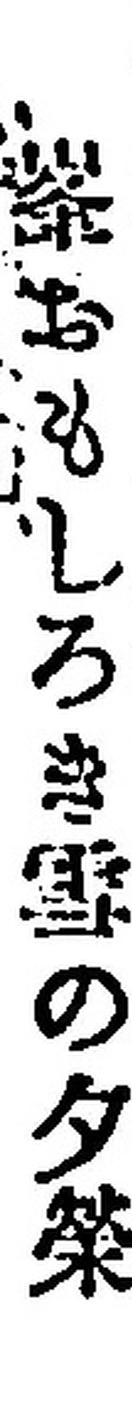峯おもしろき雪の夕栄
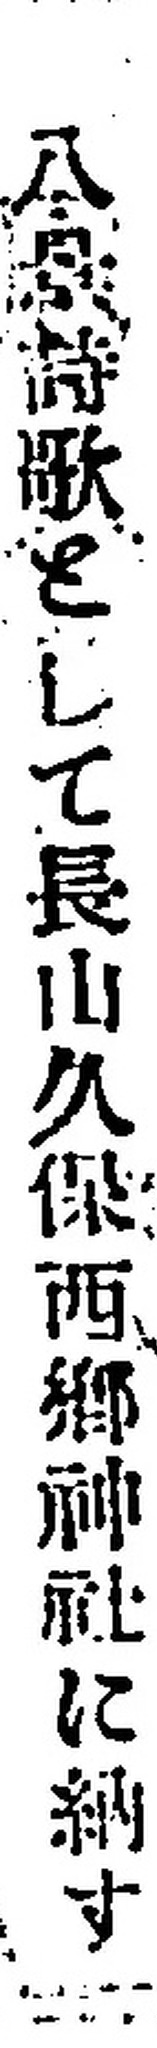八景詩歌として長山久保西郷神社に納す
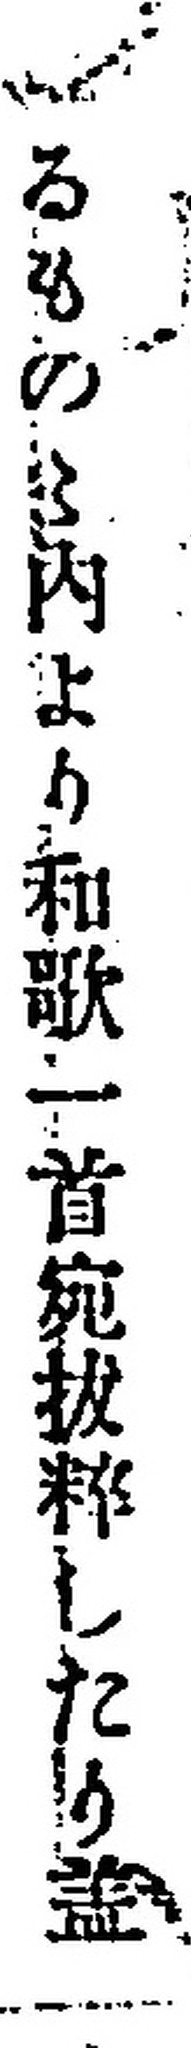るものゝ内より和歌一首宛抜粋したり蓋
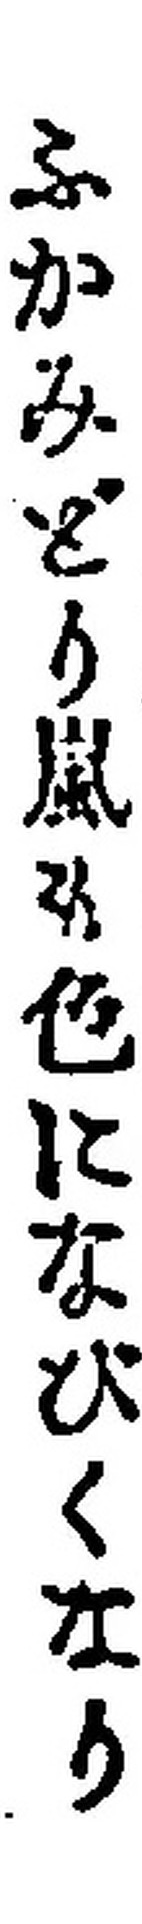ふかみどり嵐も色になびくなり

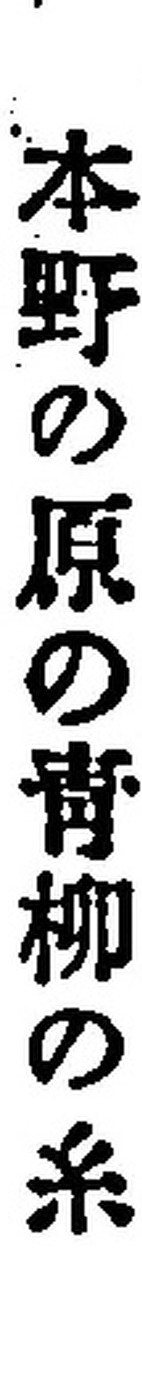本野の原の青柳の糸
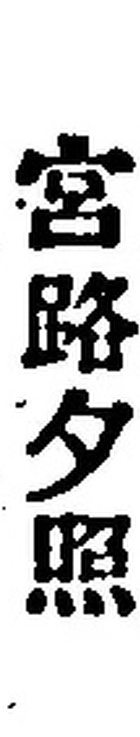宮路夕照
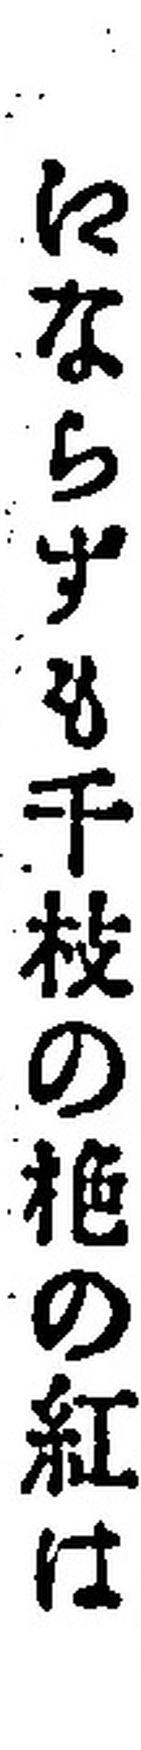えならずも千枝の栬の紅は
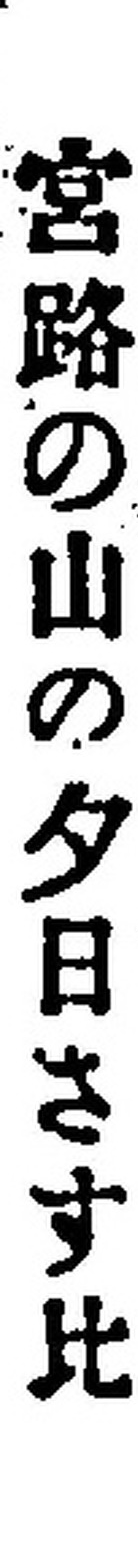宮路の山の夕日さす比
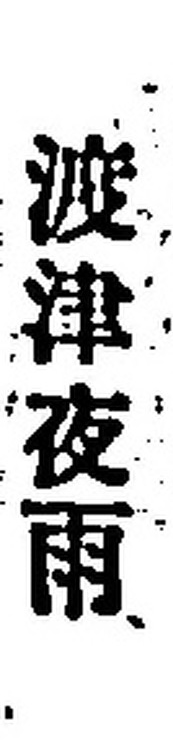渡津夜雨
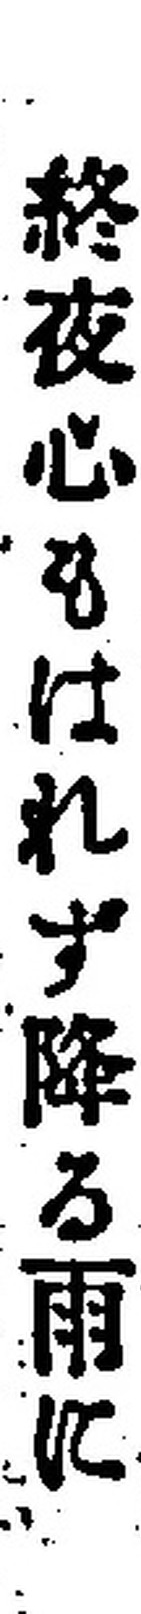終夜心もはれず降る雨に
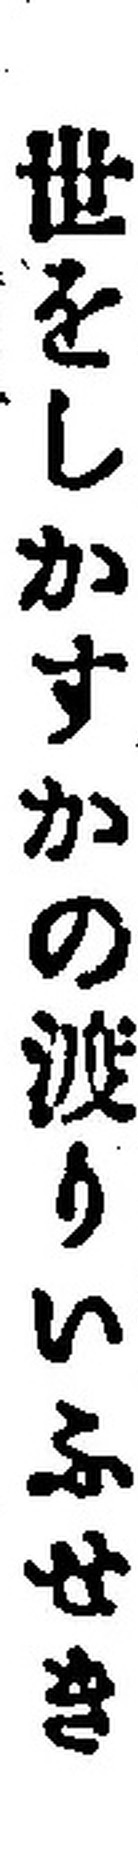世をしかすかの渡りいふせき
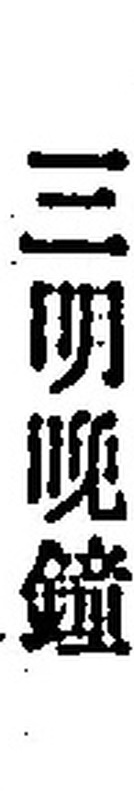三明晩鐘
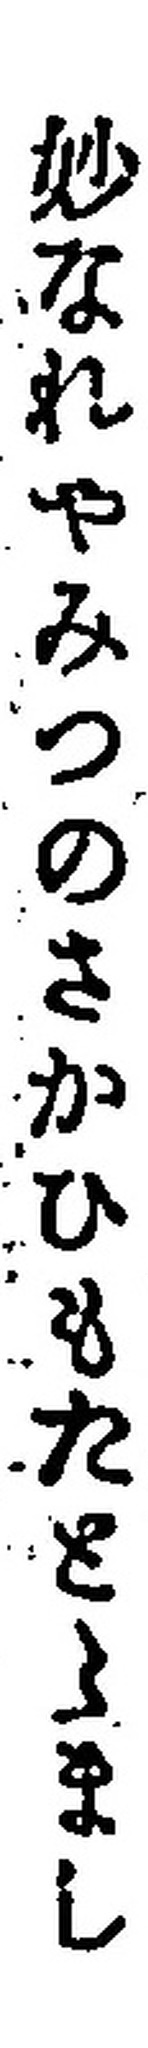妙なれやみつのさかひもたとゝまし
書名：東参名勝案内
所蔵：国立国会図書館 National Diet Library, JAPAN
